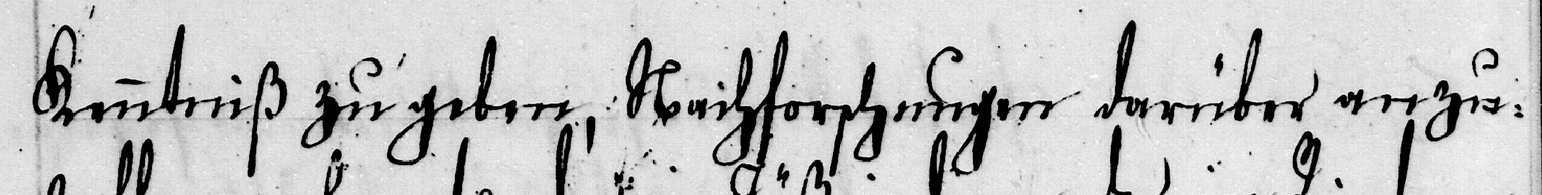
Kenntniß zu geben, Nachforschungen darüber anzu¬
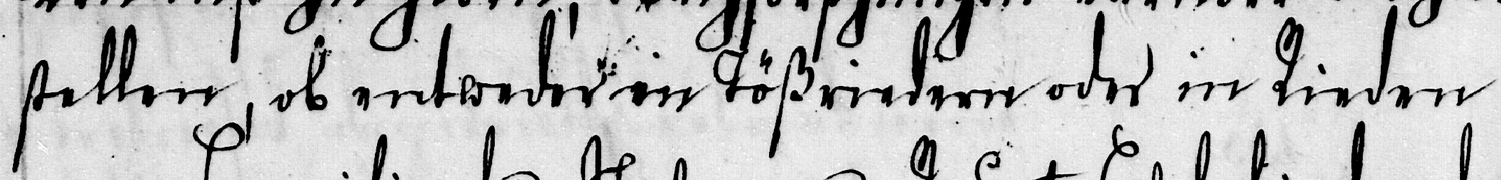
stellen, ob entweder in Tößriedern oder in Rieden
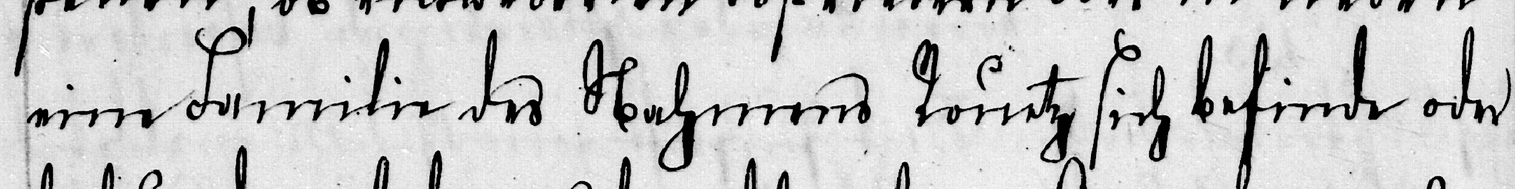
eine Familie des Nahmens Rouetz sich befinde oder
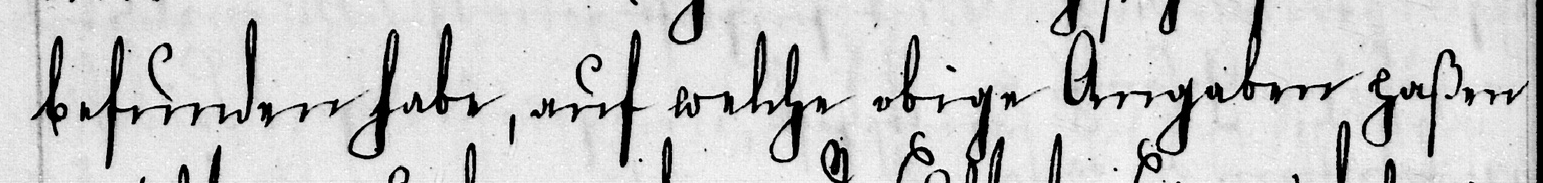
befunden habe, auf welche obige Angaben paßen
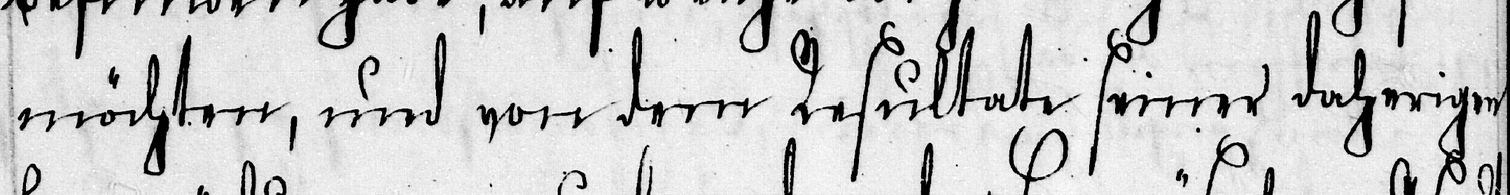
möchten, und von dem Resultate seiner daherigen
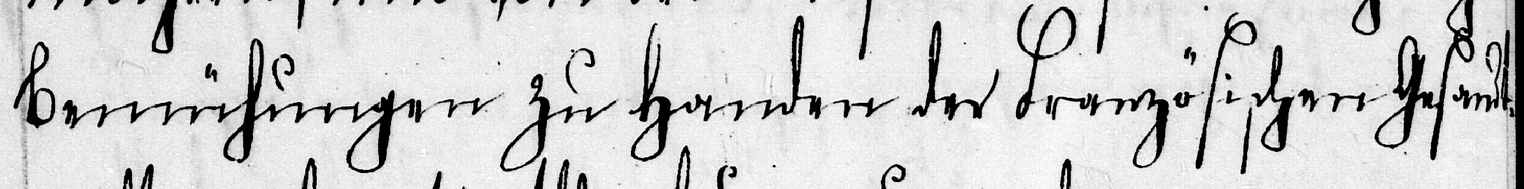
Bemühungen zu Handen der Französischen Gesandt¬
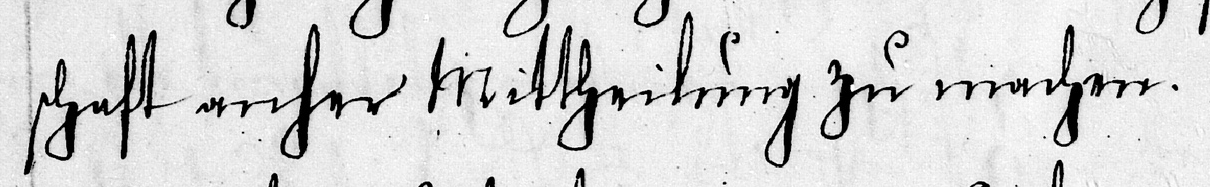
schaft anher Mittheilung zu machen.
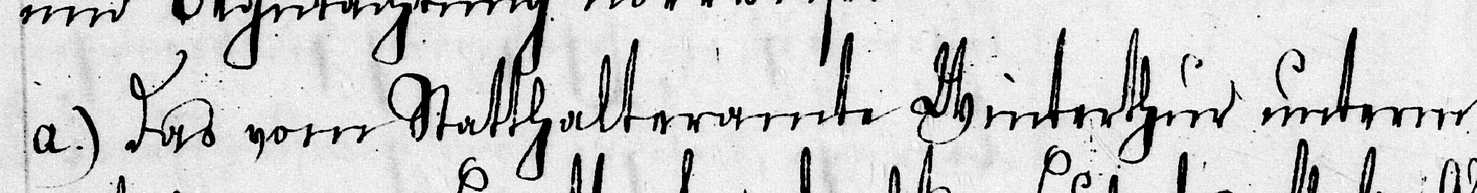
a.) Das vom Statthalteramte Winterthur unterm
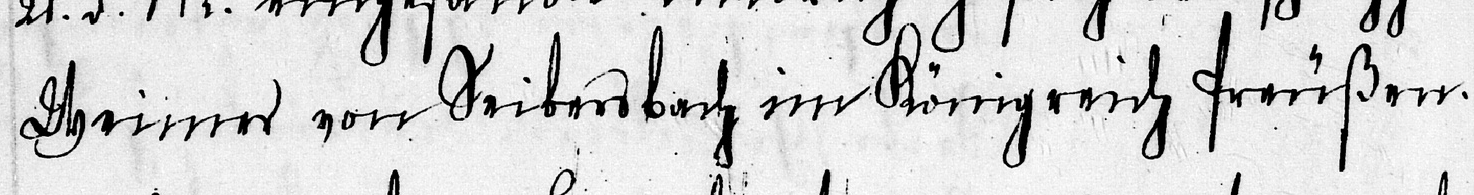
Weimer von Seibersbach im Königreich Preußen.
